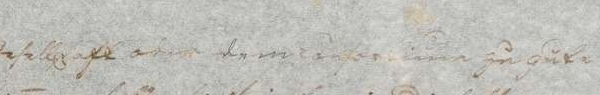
Gesellschaft oder dem Consortium zu gute
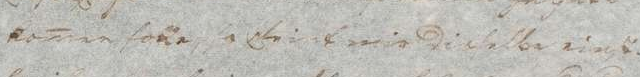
kommen solle, so scheint mir dieselbe einst-
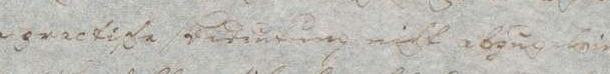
practische Bedeutung nicht abzugewin-
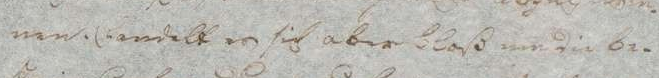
nen. Handelt es sich aber bloß um die be-
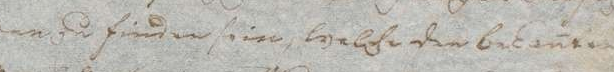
hren zu finden sein, welche den bekannten
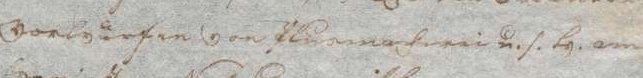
Vorwürfen von Plusmacherei u. s. w. am
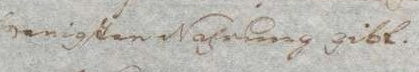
wenigsten Nahrung gibt.
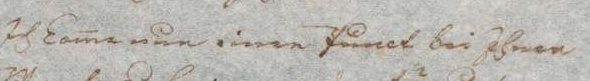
Ich komme nun einen Punct bei Ihnen
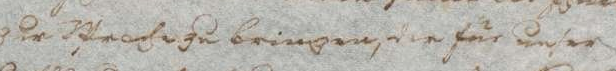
zur Sprache zu bringen, der für unser
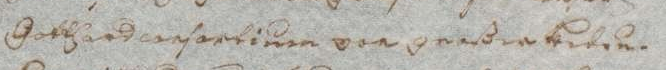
Gotthardconsortium von großer Bedeu-
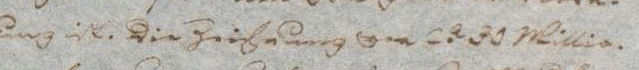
tung ist. Die Zeichnung von ca 30 Millio-
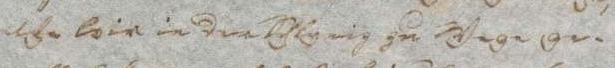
welche wir in der Schweiz zu Wege ge-
